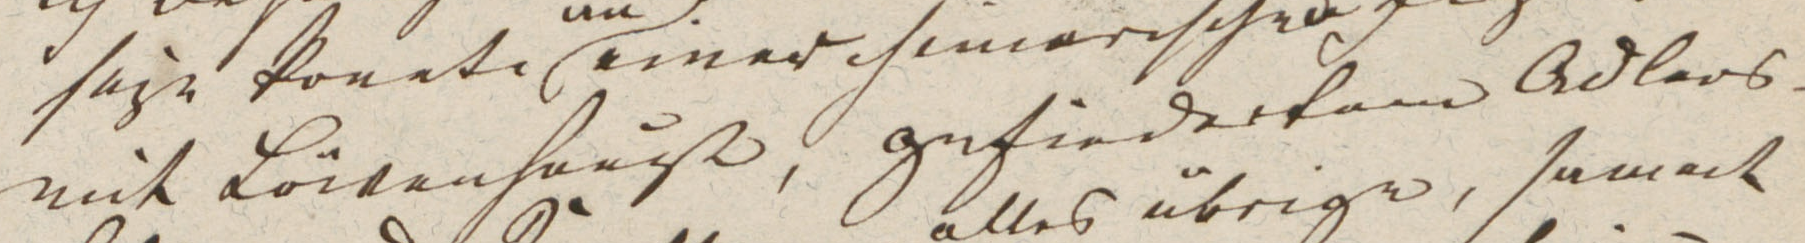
mit Löwenhaupt, gefiedertem Adlers-
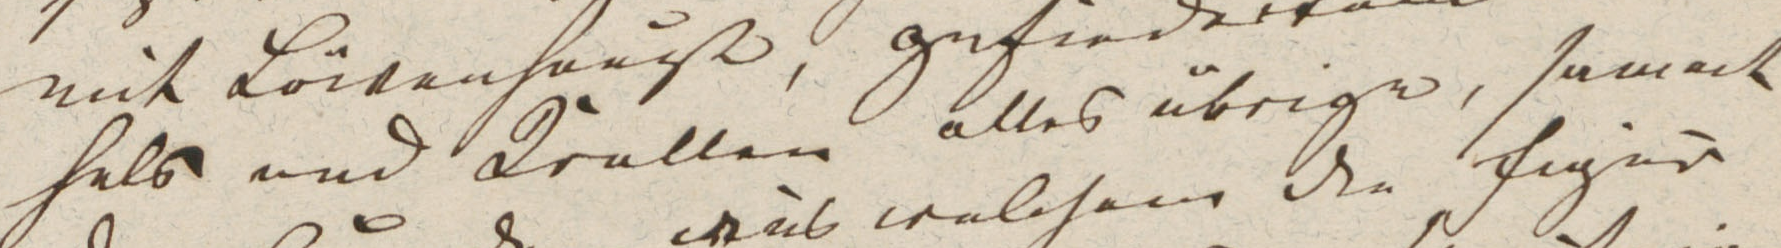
hals und Krallen alles übrige, sammt
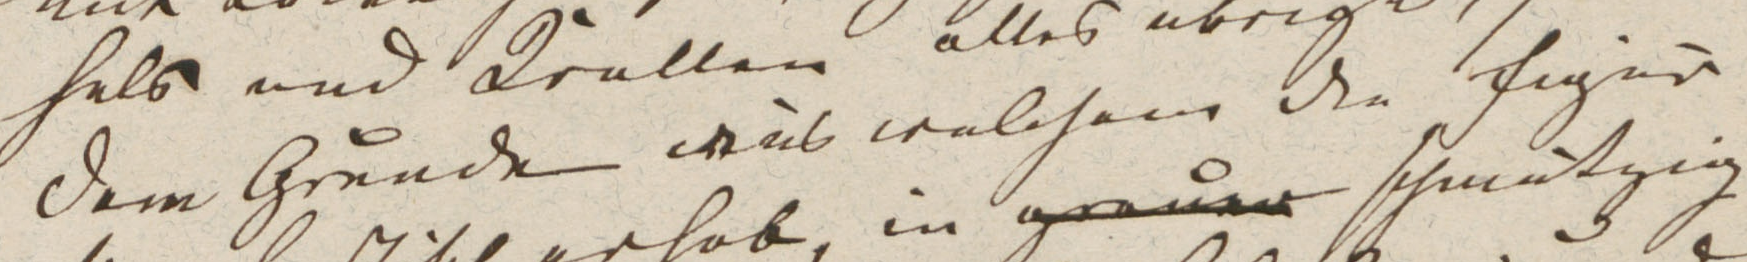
dem Grunde aus welchem die Figur
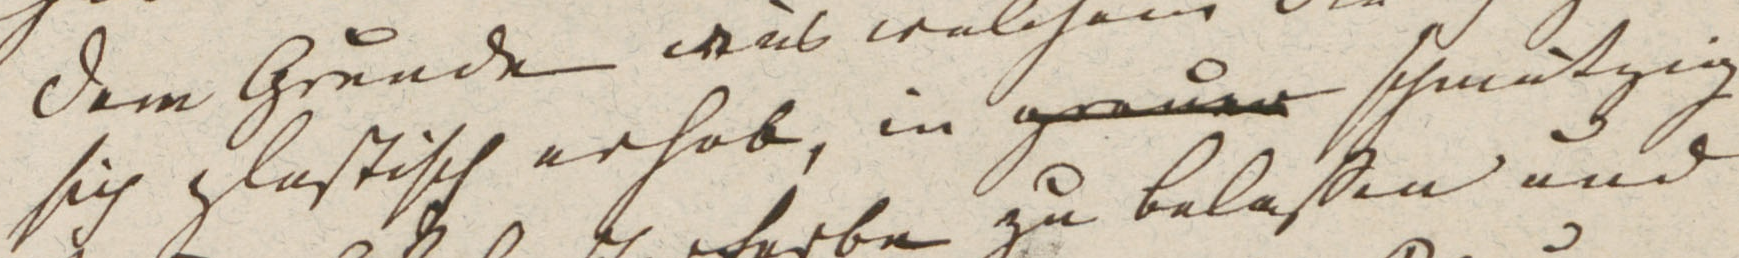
sich plastisch erhob, in grauer schmutzig
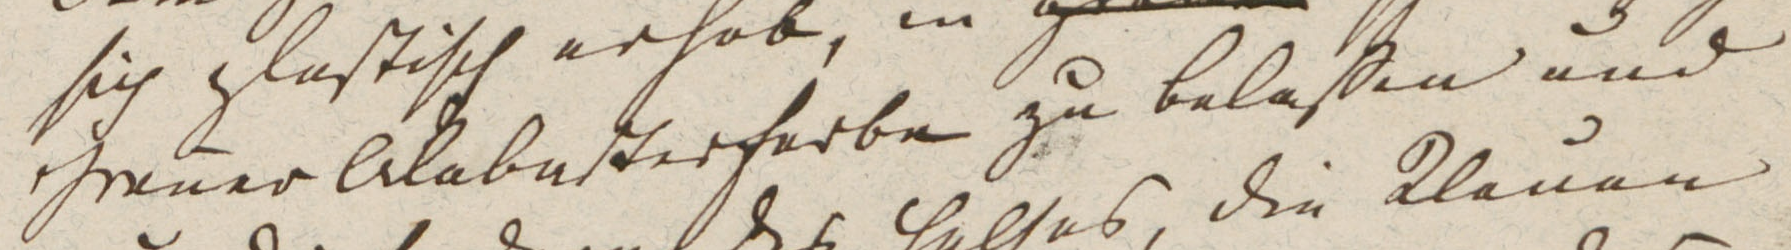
grauer Alabasterfarbe zu belassen und
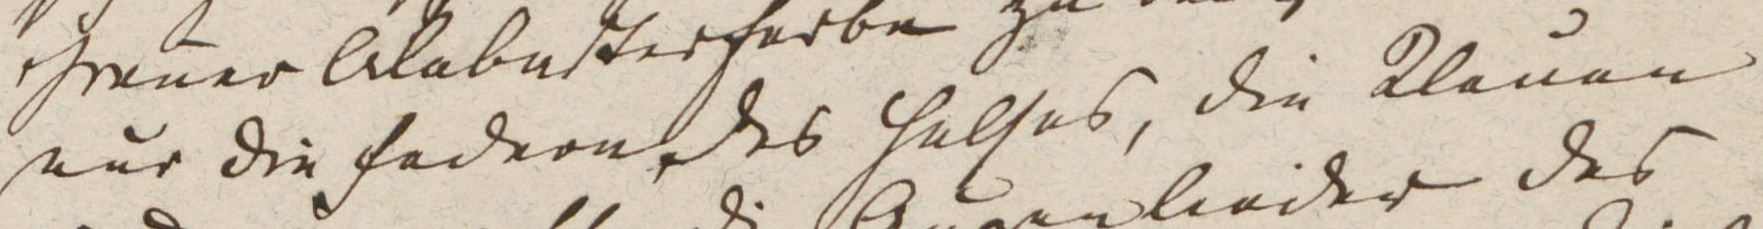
nur die Federn des Halses, die Klauen
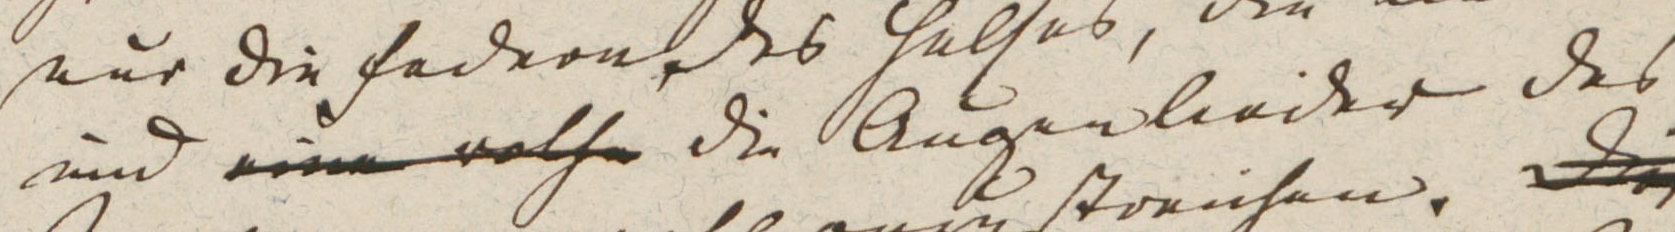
und eine roth die Augenlieder des
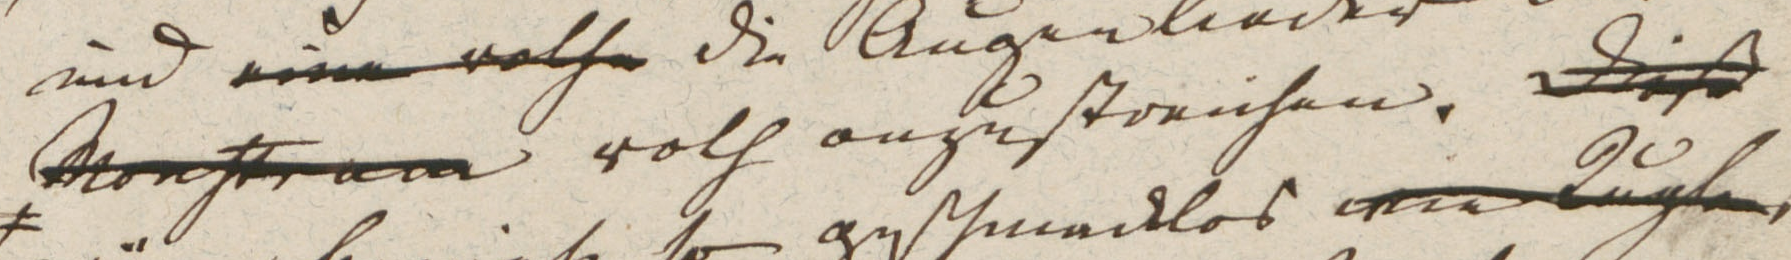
Monstrum roth anzustreichen. Diess
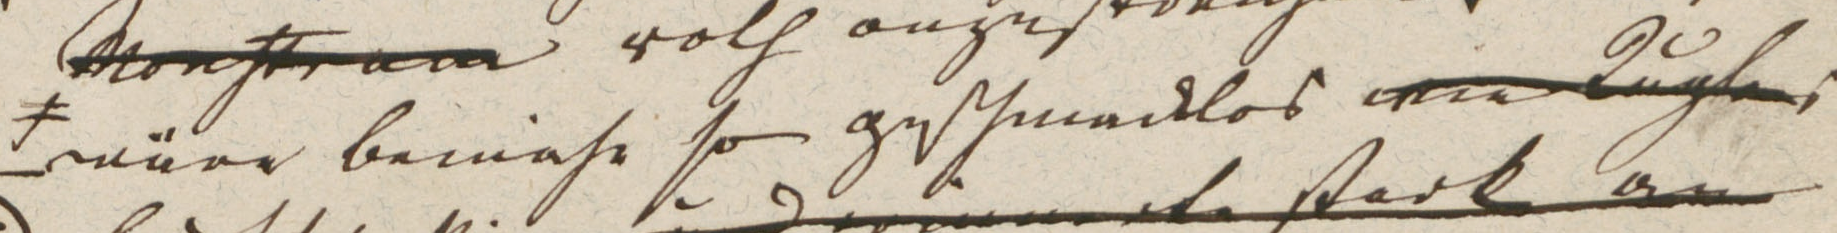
% wäre beinahe so geschmacklos wie Kuglers
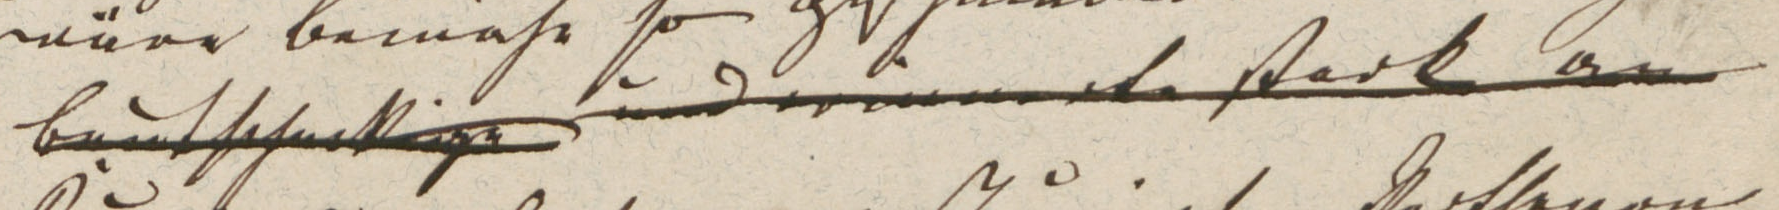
buntscheckige und erinnerte stark an
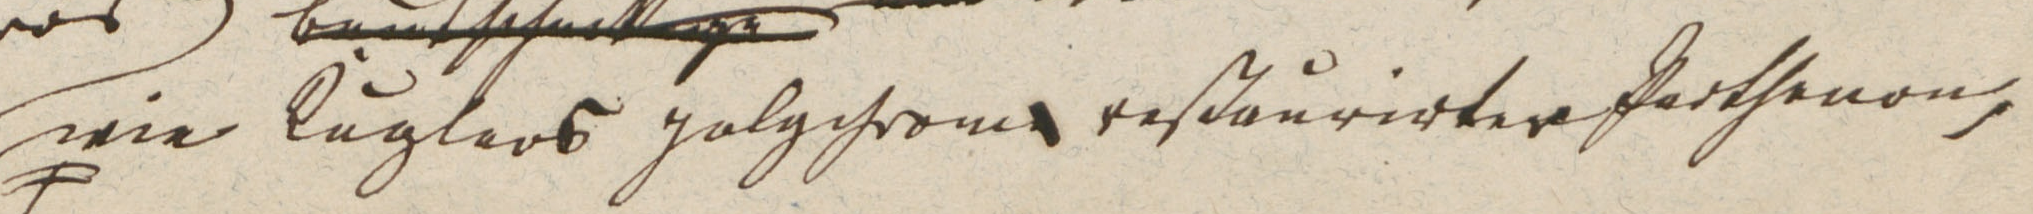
% wie Kuglers polychrome restaurirter Parthenon,
